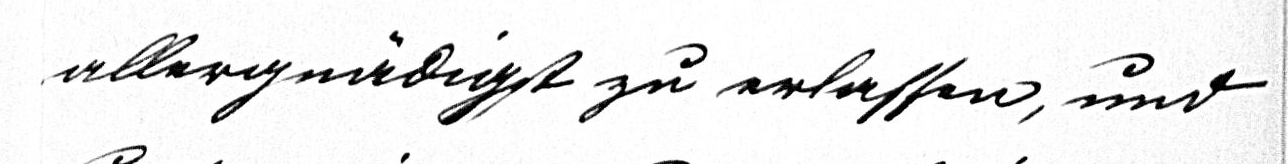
allergnädigst zu erlassen, und
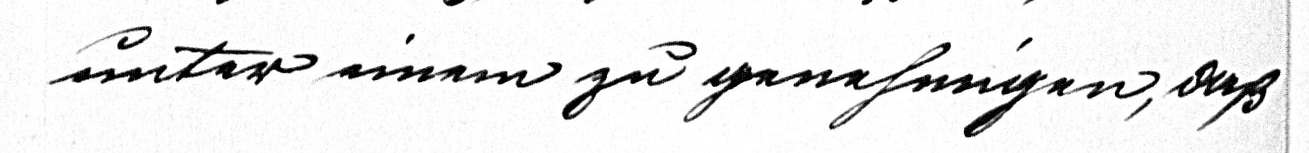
unter einem zu genehmigen, daß
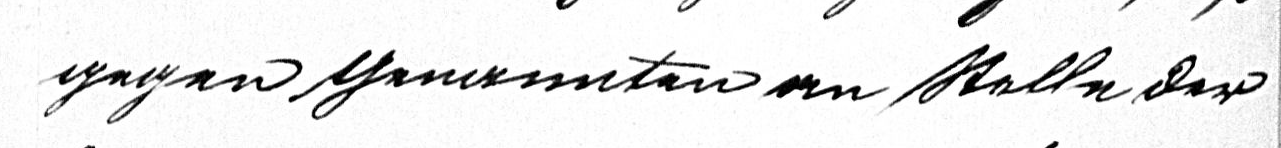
gegen Genannten an Stelle der
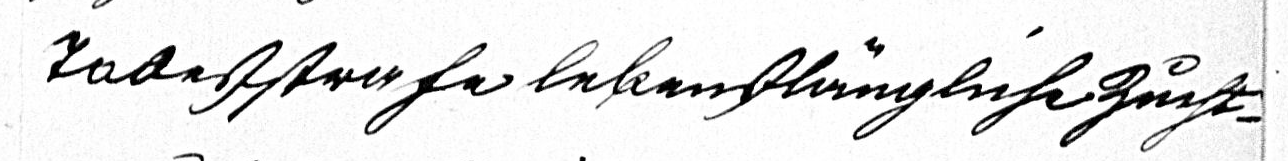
Todesstrafe lebenslängliche Zucht¬
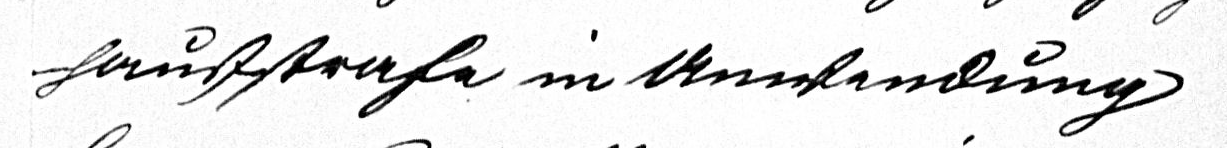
hausstrafe in Anwendung
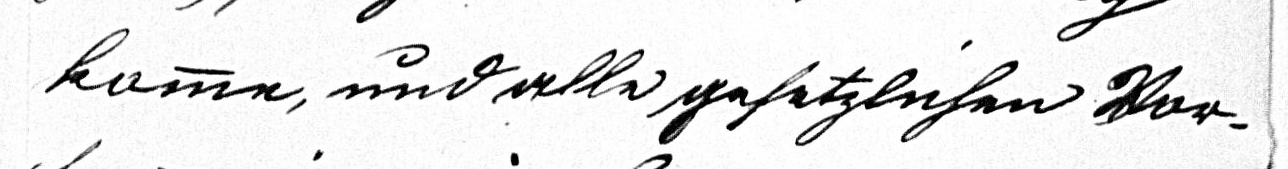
komme, und alle gesetzlichen Vor¬
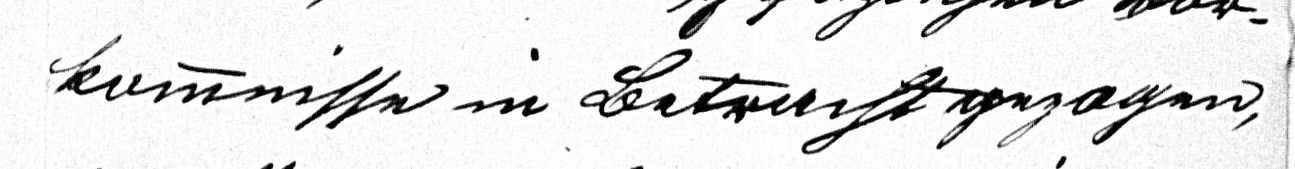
kommnisse in Betracht gezogen,
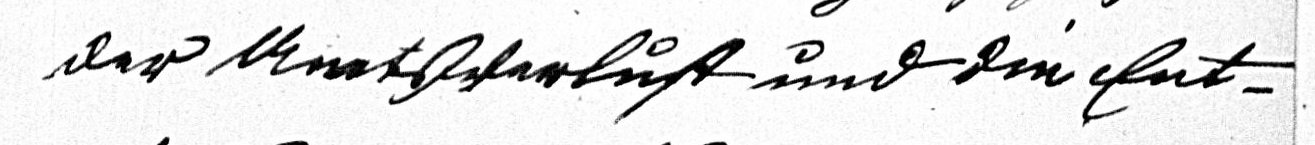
der Amtsverlust und die Ent¬
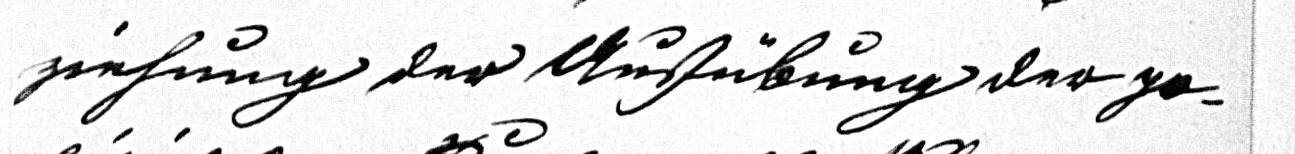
ziehung der Ausübung der po¬
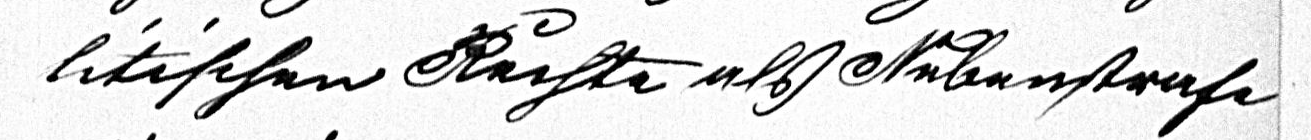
litischen Rechte als Nebenstrafe
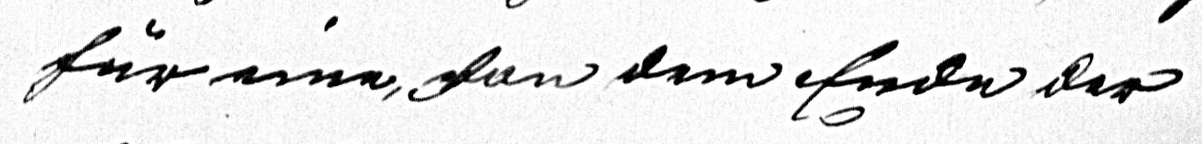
für eine, von dem Ende der
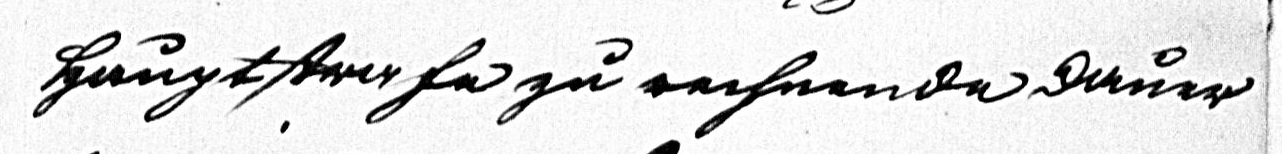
Hauptstrafe zu rechnende Dauer
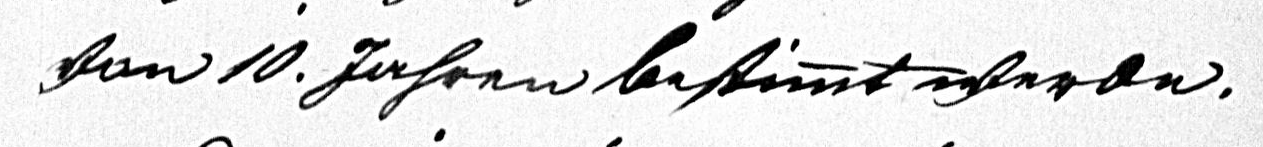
von 10. Jahren bestimmt werde.
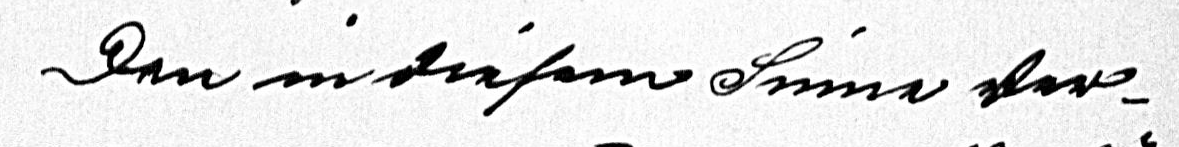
Den in diesem Sinne ver¬
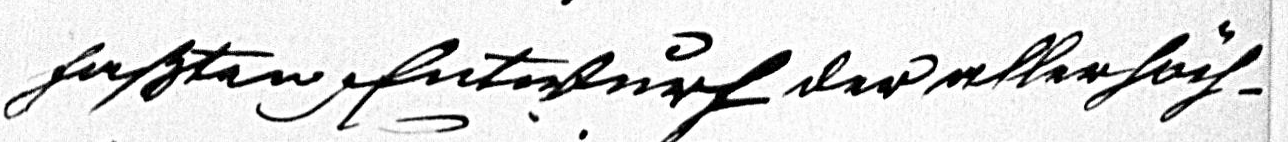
haßten Entwurf der aller höch¬
